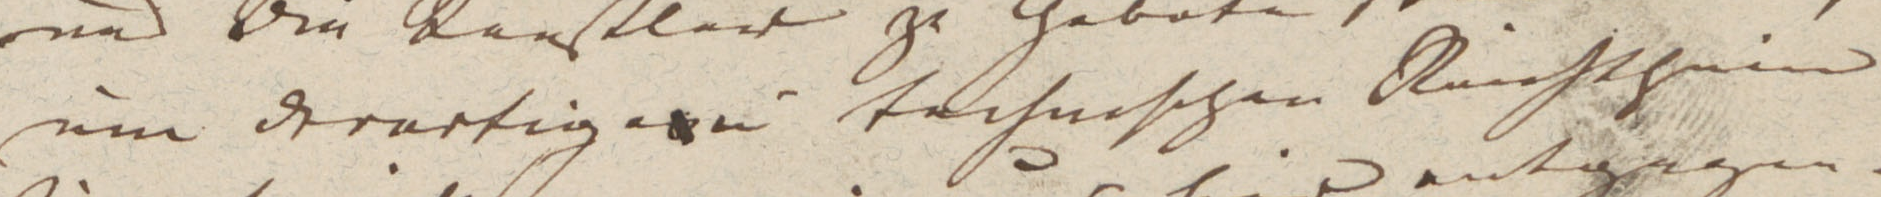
um derartigen technischen Reichthum
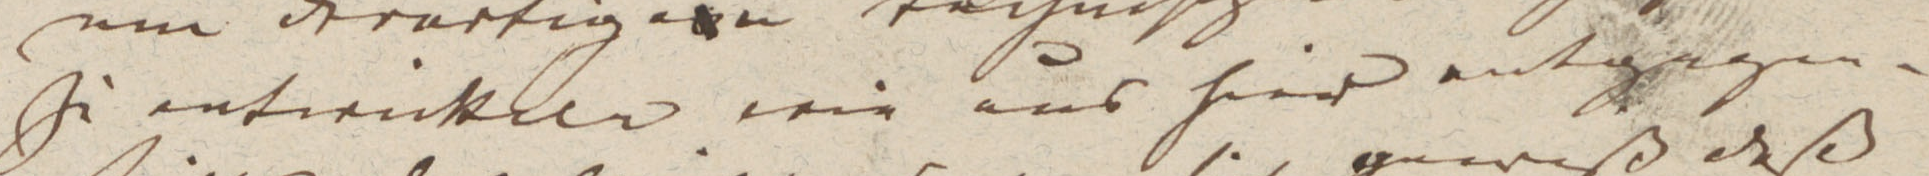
zu entwickeln wie uns hier entgegen-
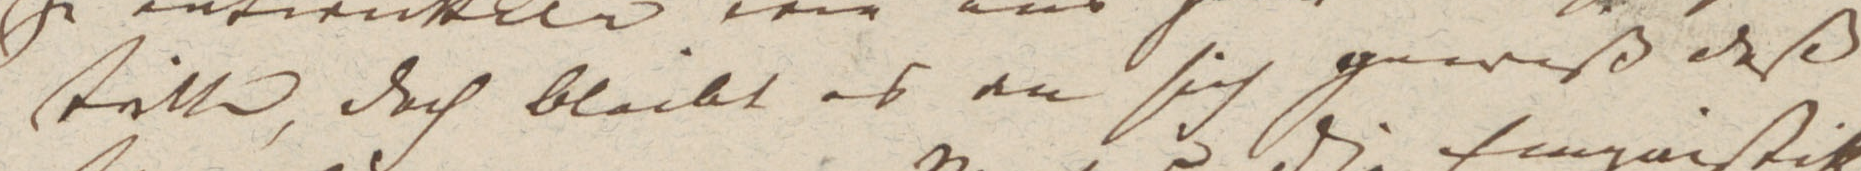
tritt, doch bleibt es an sich gewiss dass
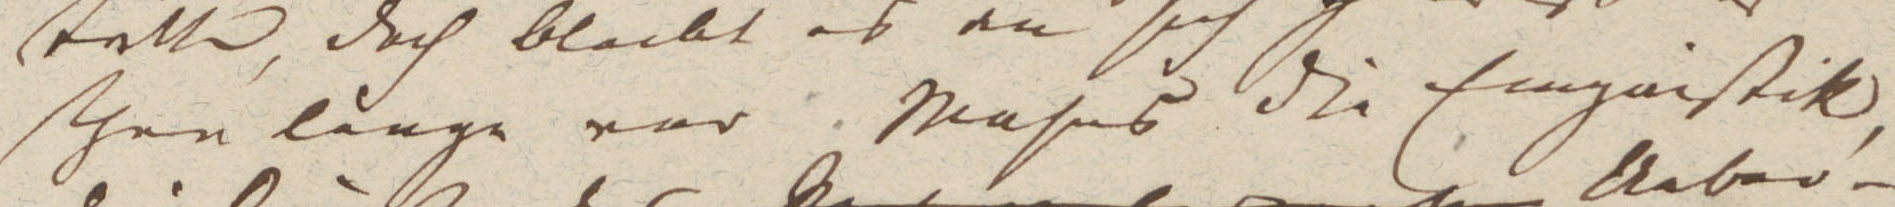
schon lange vor Moses die Empaistik,
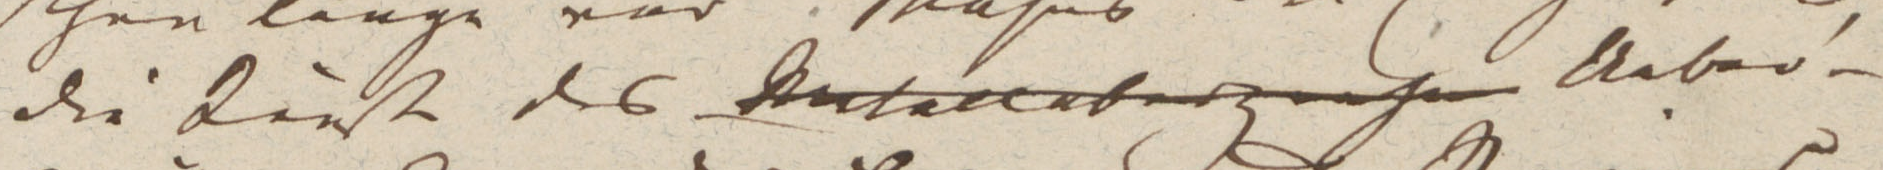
die Kunst des Metalluberziehe Ueber-
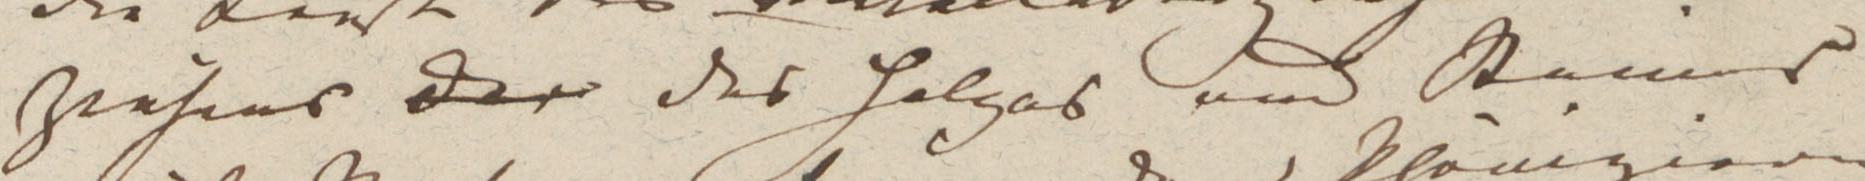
ziehens der des Holzes und Steines
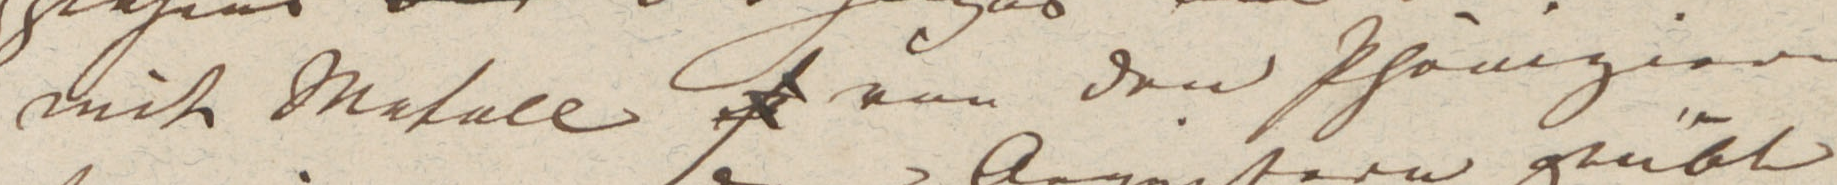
mit Metall von den Phöniziern
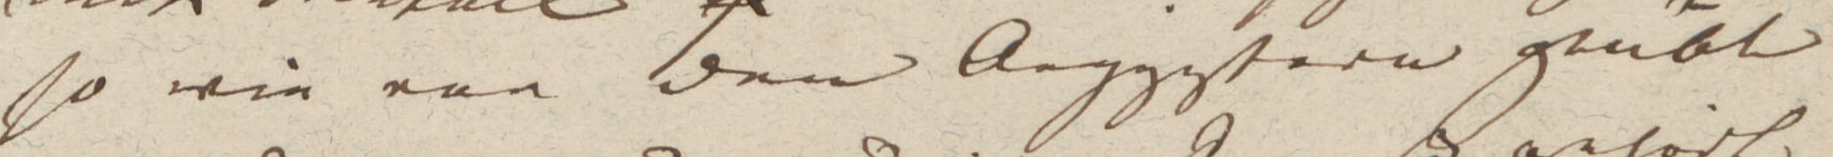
so wie von den Aegyptern geübt
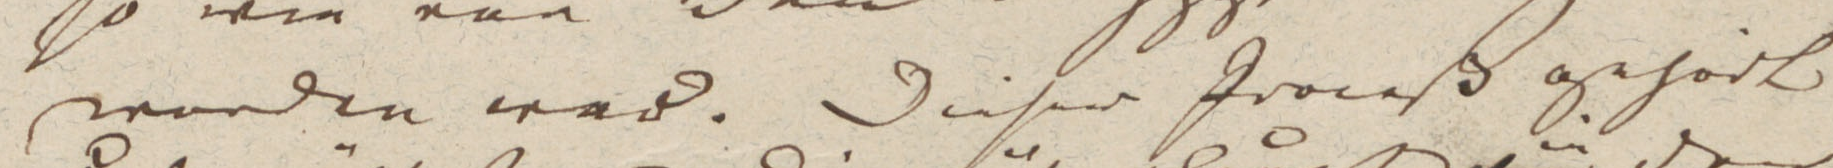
worden war. Dieser Process gehört
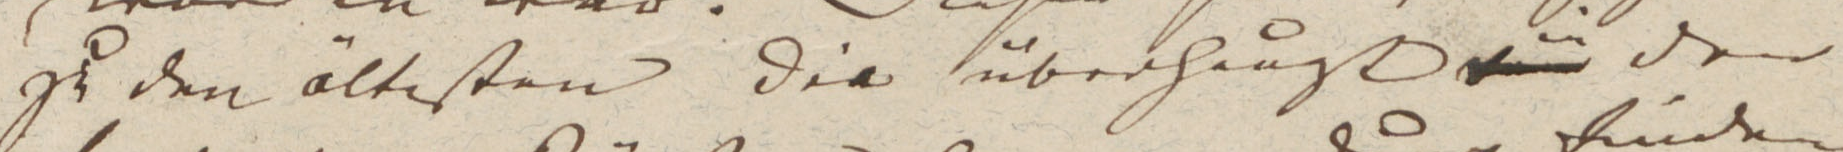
zu den ältesten die überhaupt in den
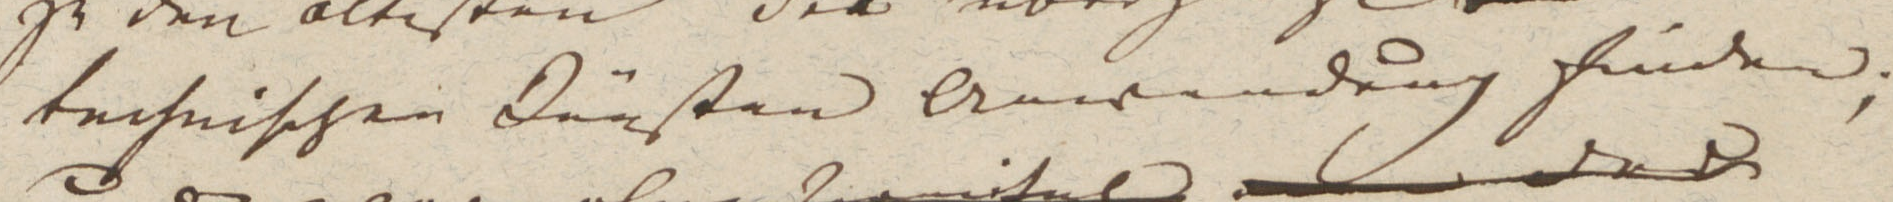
technischen Künsten Anwendung finden;
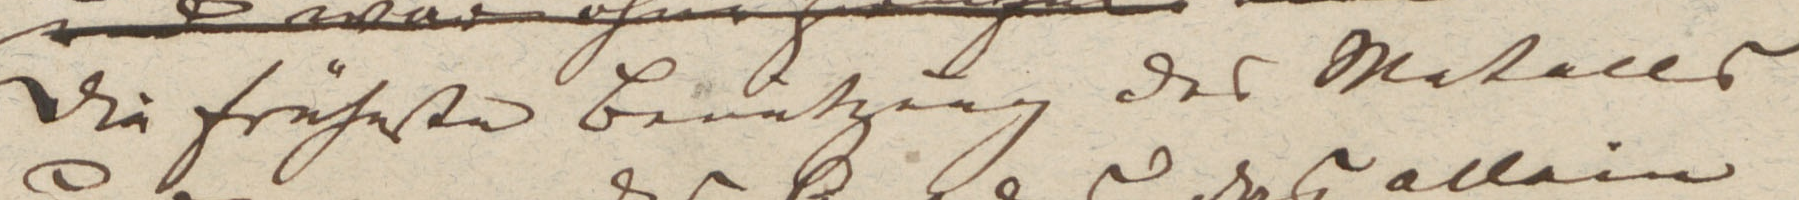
dDie früheste Bentzung des Metalls
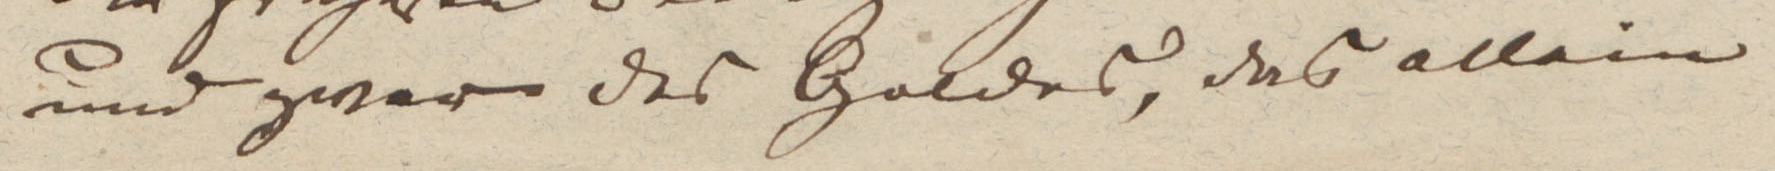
und zwar des Goldes, das allein
